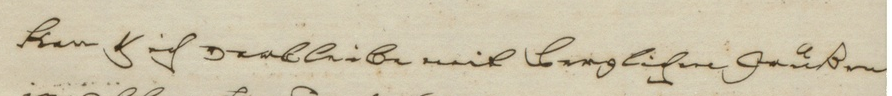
ken & ich verbleibe mit herzlichen Grüßen
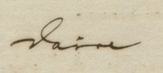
Dein
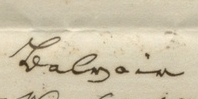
Belvoir
